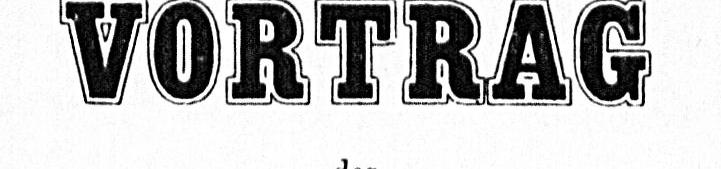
VORTRAG
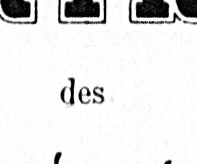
des
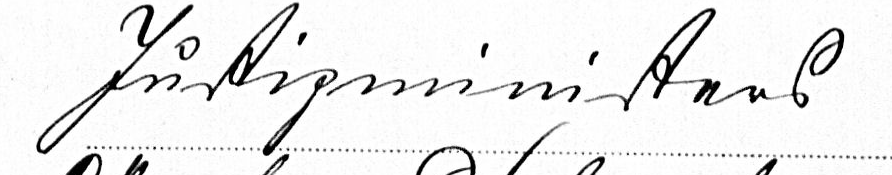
Justizministers
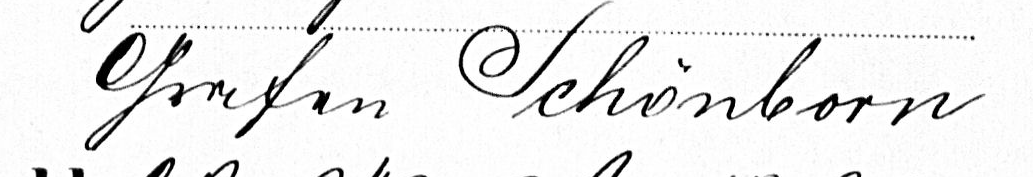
Grafen Schönborn
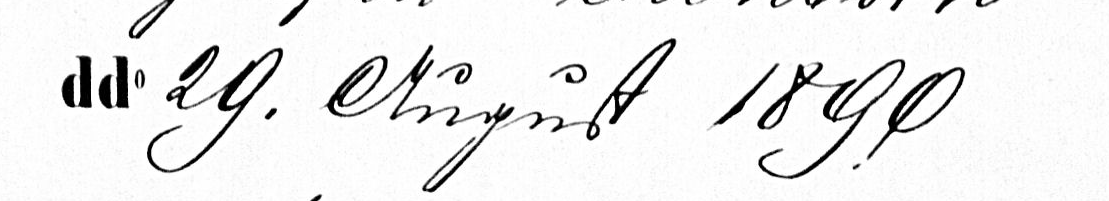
dd° 29. August 1890
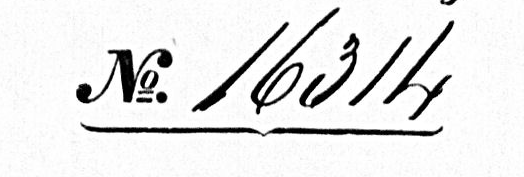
N° 16314
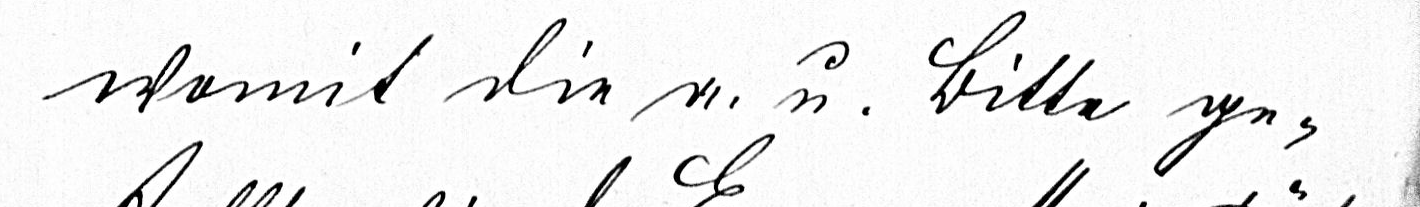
womit die a. u. Bitte ge¬
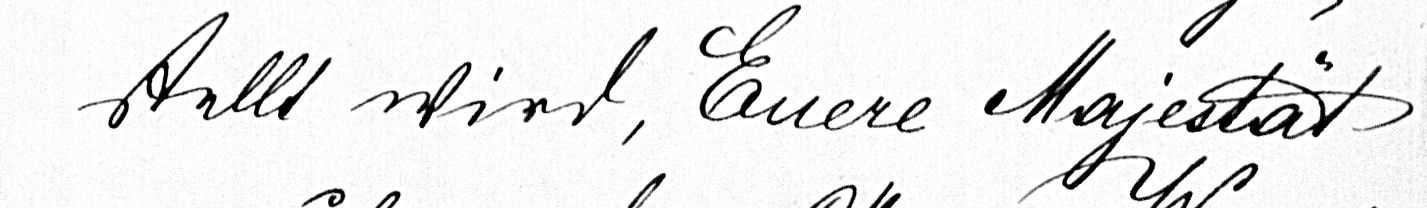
stellt wird, Euere Majestät
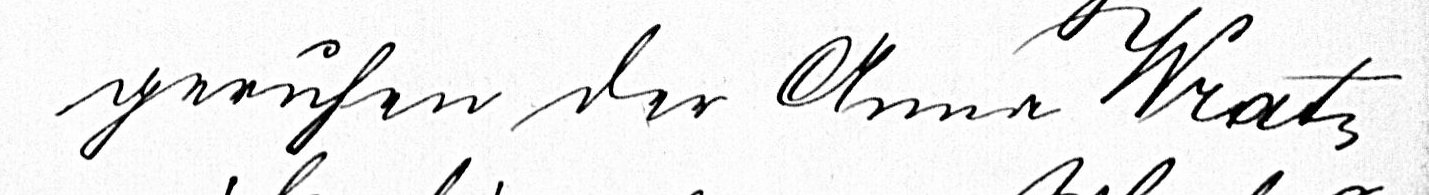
geruhen der Anna Wrat¬
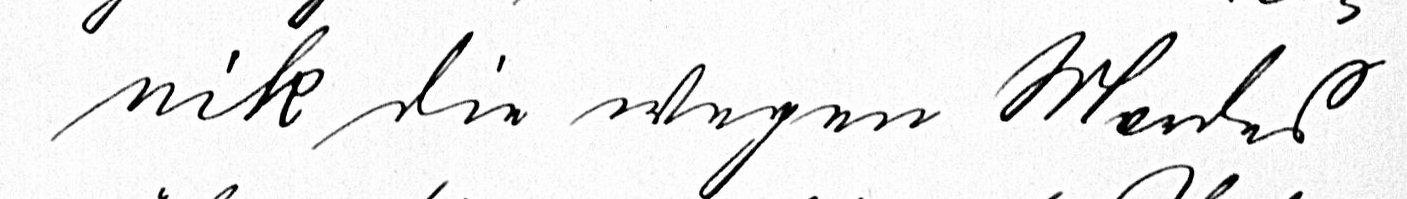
nik die wegen Mordes
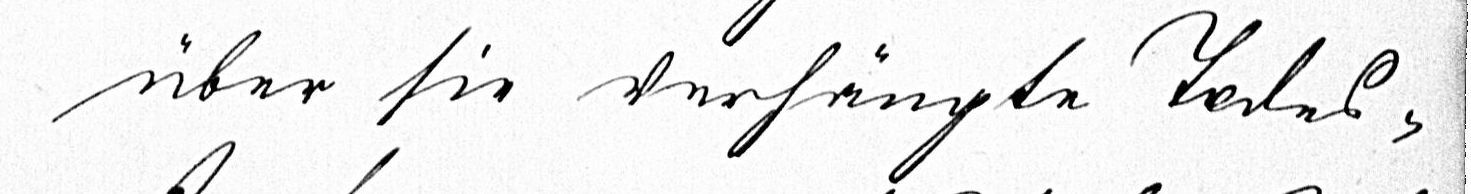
über sie verhängte Todes¬
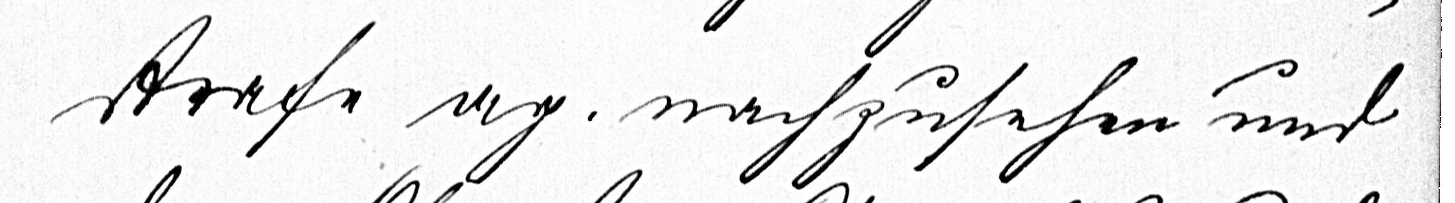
strafe ag. nachzusehen und
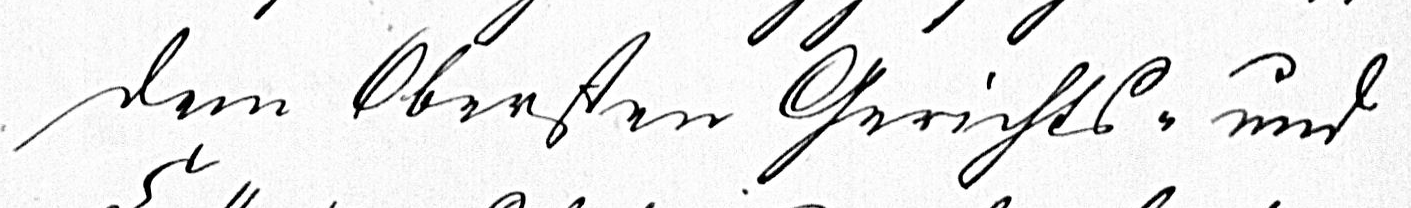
dem Obersten Gericht- und
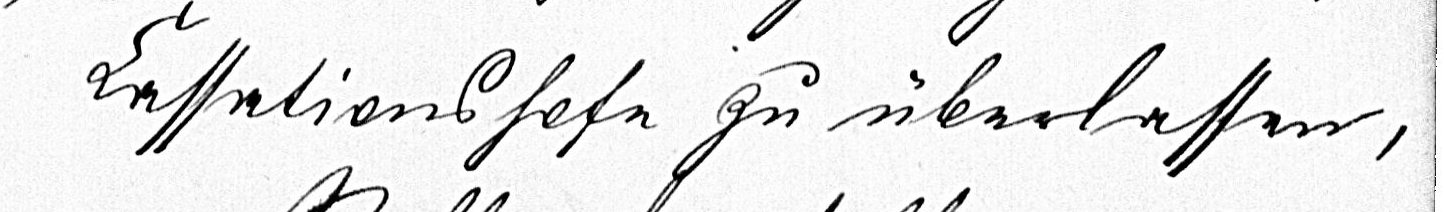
Cassationshofe zu überlassen,
